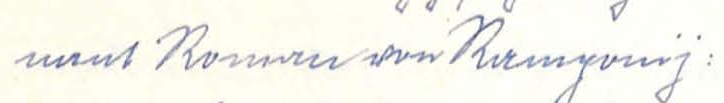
nant Roman von Ramponij:
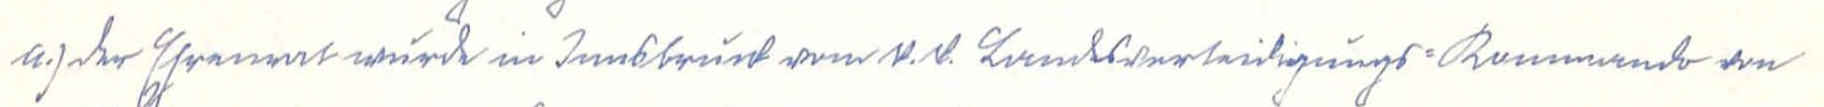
a.) Der Ehrenrat wurde in Innsbruck vom k.k. Landesverteidigungs-Kommando von
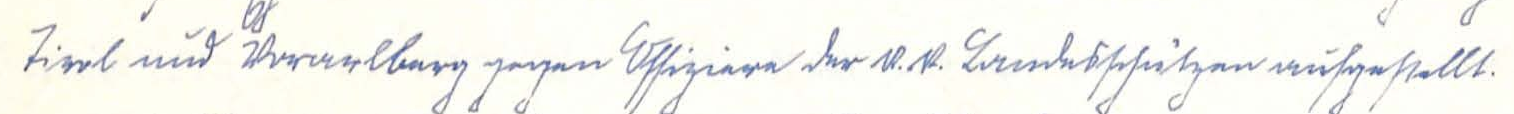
Tirol und Vorarlberg gegen Offiziere der k.k. Landesschützen aufgerollt.
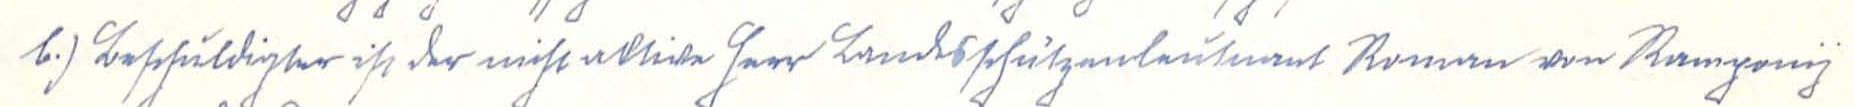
b.) Beschuldigter ist der nicht Aktive Herr Landeschützenleutnant Roman von Ramponij
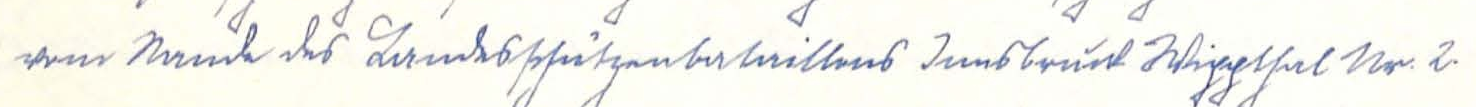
vom Stande des Landesschützenbataillons Innsbruck Wippthal Nr.2
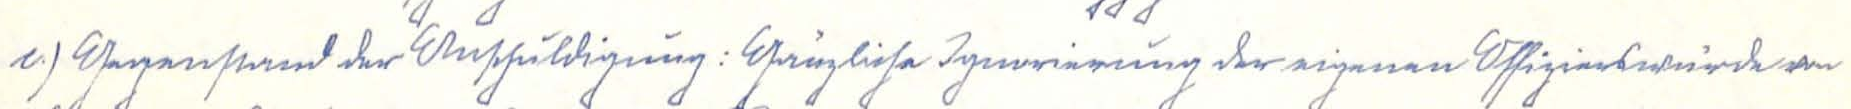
c.) Gegenstand der Anschuldigung: Gänzliche Ignorierung der eigenen Offizierswürde von
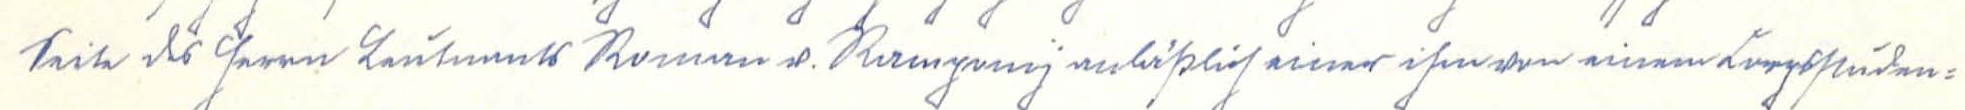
Seite des Herrn Leutnants Roman v. Rompanij anläßlich einer ihm von einem Corpsstuden-
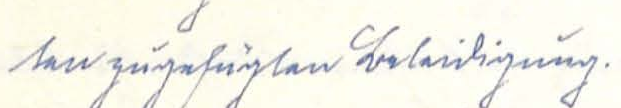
ten zugefügten Beleidigung.
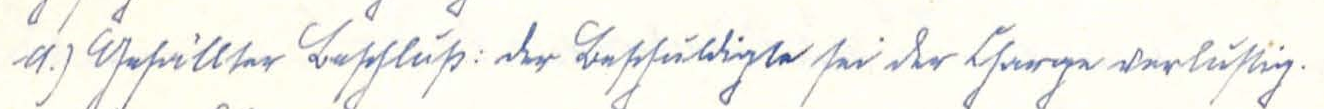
d.) Gefällter Beschluß: Der Beschuldigte sei der Charge verlustig.
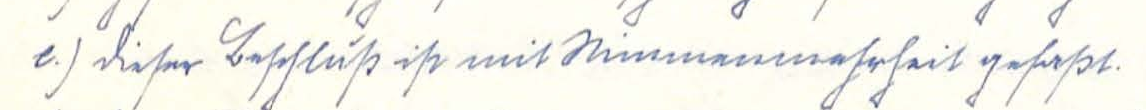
e.) Dieser Beschluss ist mit Stimmenmehrheit gefaßt.
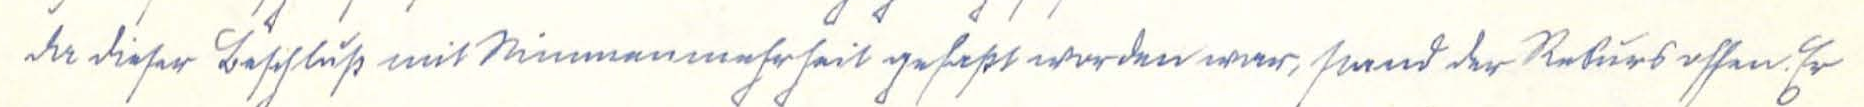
Da dieser Beschluss mit Stimmenmehrheit gefaßt worden war, stand der Rekurs offen. Er
